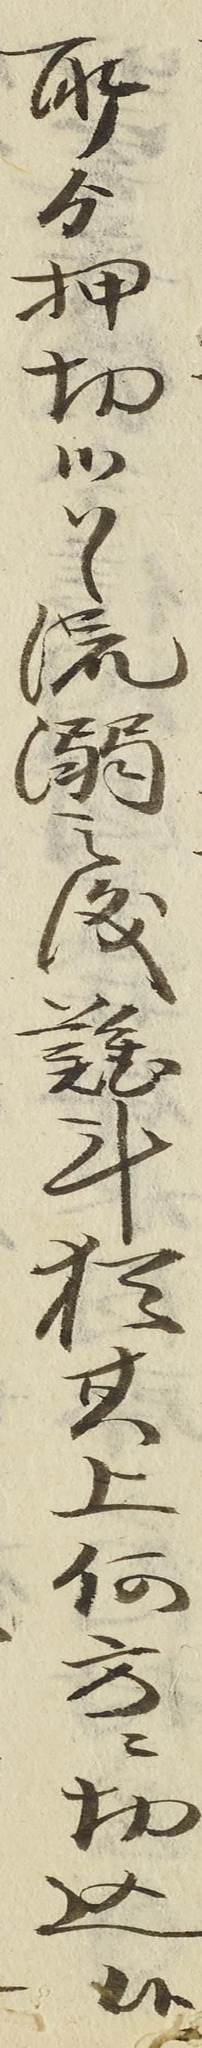所押切候ハゝ流弱之儀難斗猶其上何方二切込候
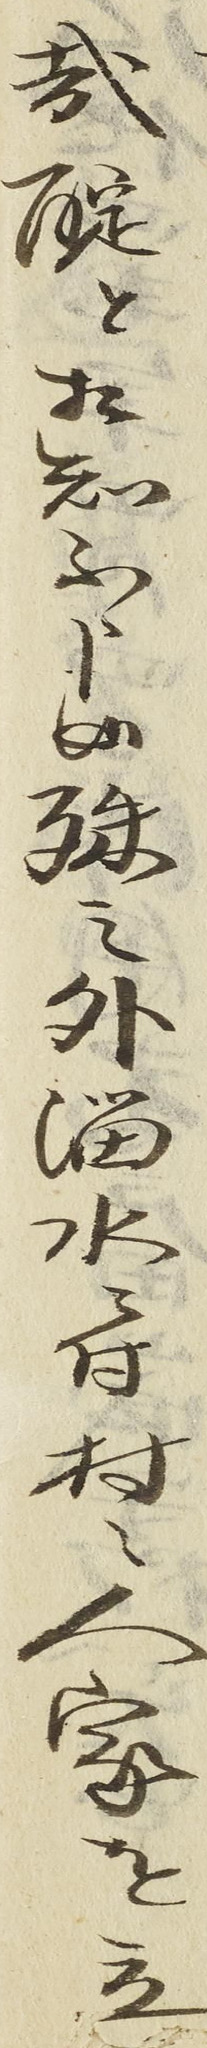哉聢と相知不申故殊之外溜水二付村々人家を立
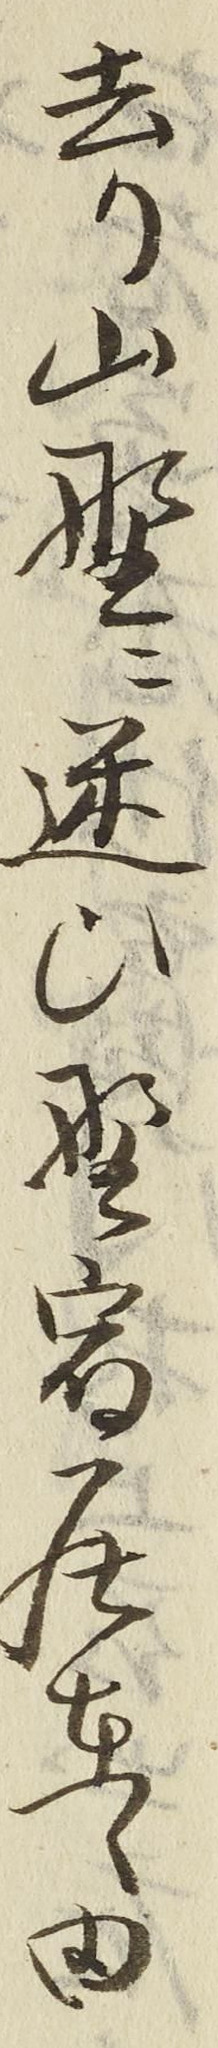去り山野二迷ひ野宿罷在候由
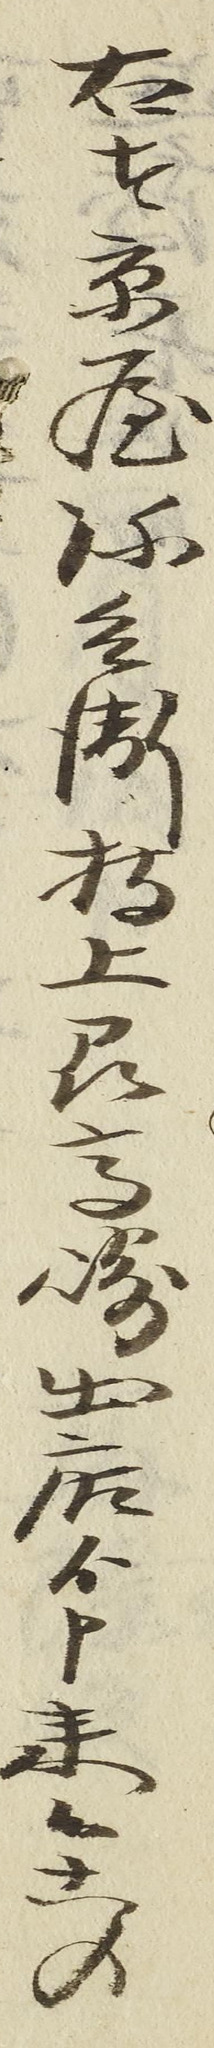右は京屋弥兵衛指上即高崎出店ゟ申来候この
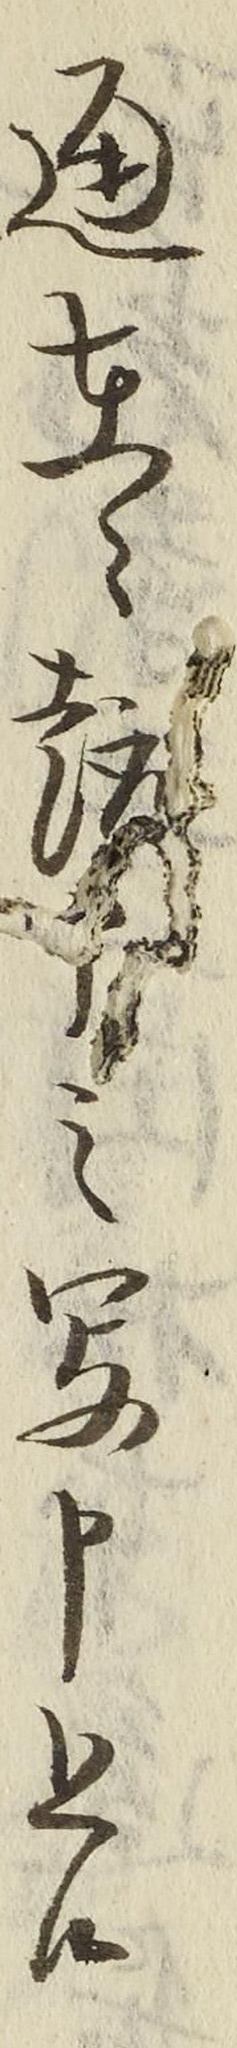通在々趣有之写申上候
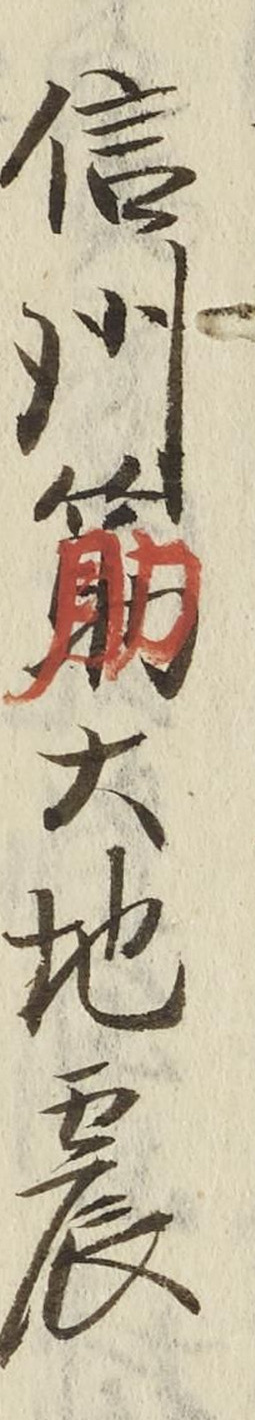信州筋大地震
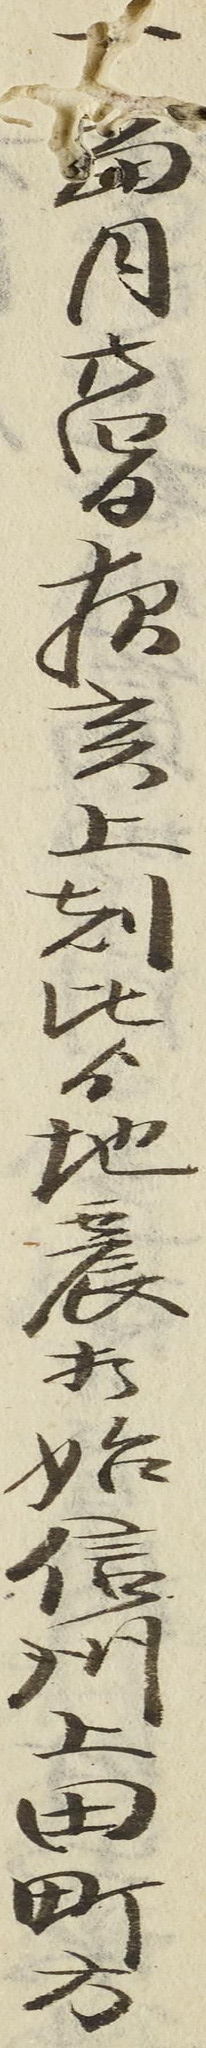一当月廿四日夜亥上刻比ゟ地震相始信州上田町方
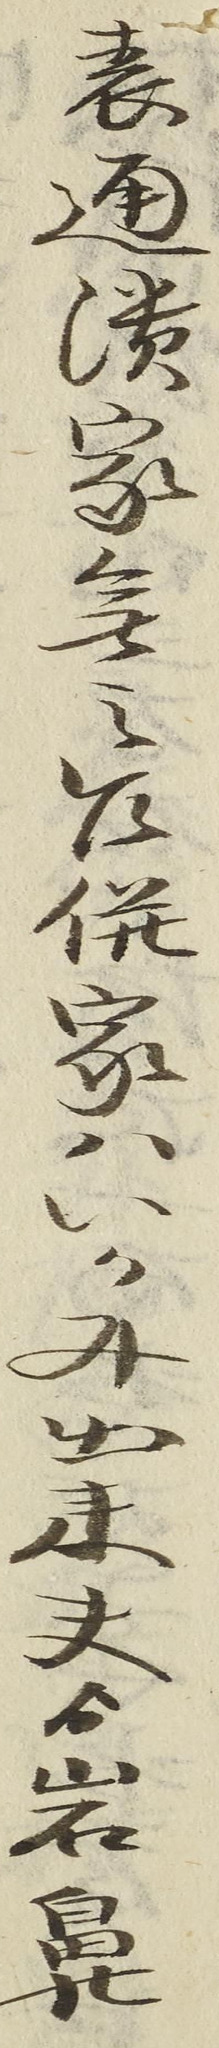表通潰家無之乍併家ハいたみ出来夫ゟ岩鼻
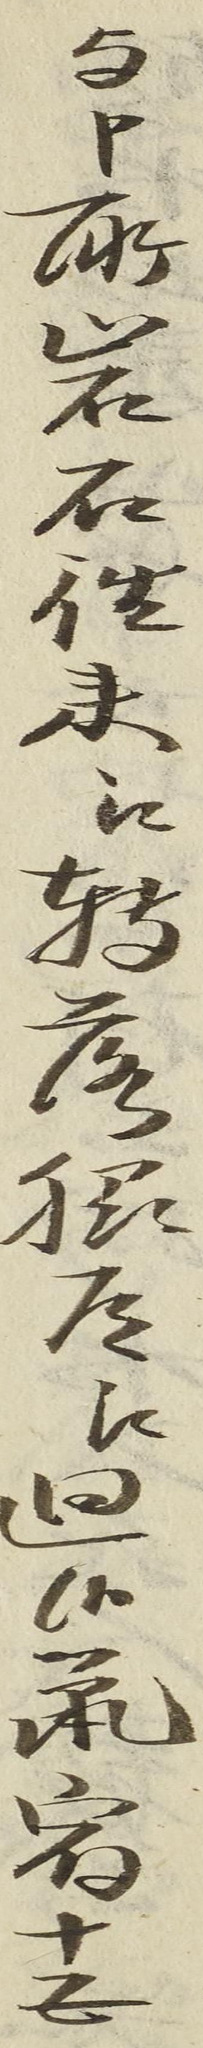と申所岩石往来江転げ落脇道江廻候鼠宿十五
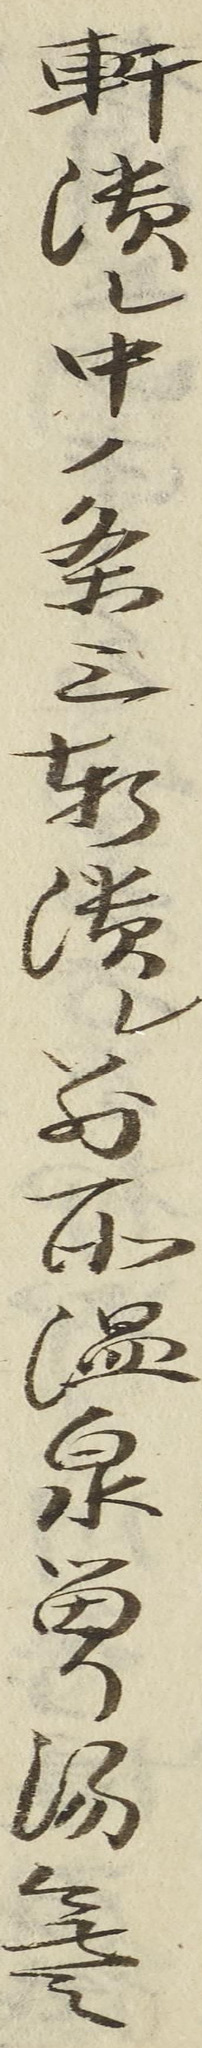軒潰レ中ノ条三軒潰レ別所温泉留り湯無之
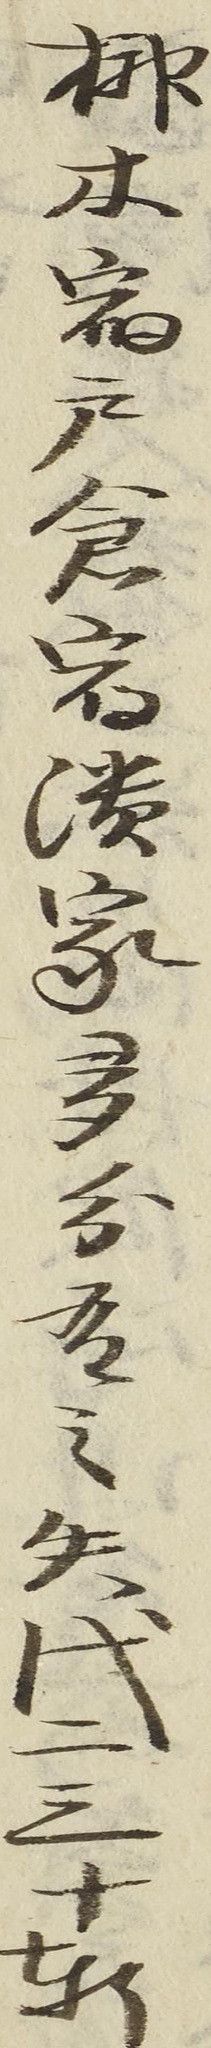柳木宿戸倉宿潰家多分有之矢代二三十軒
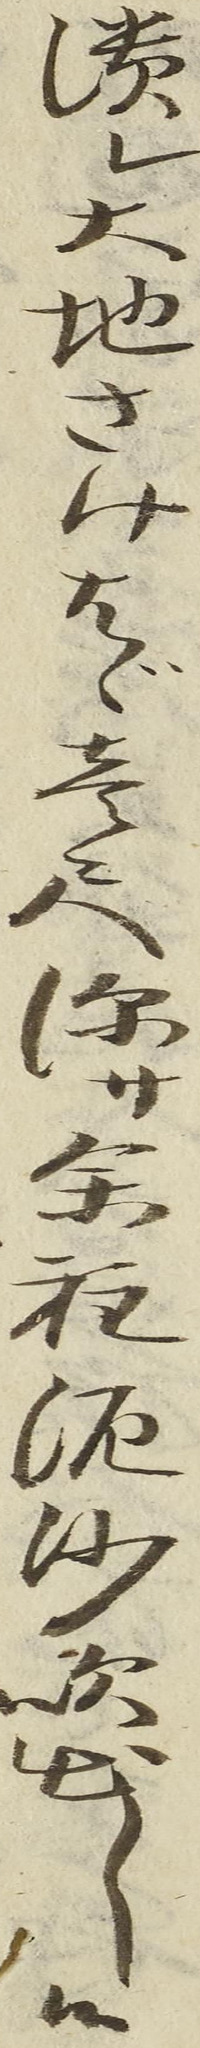潰レ大地さけはゞ壱尺深サ余程泥砂吹出し候
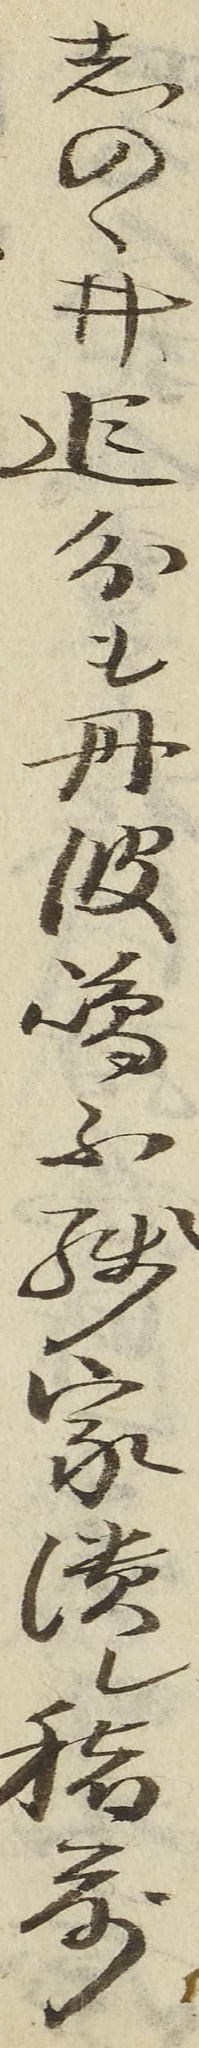しのゝ井追分も丹波嶋不残家潰レ稲荷
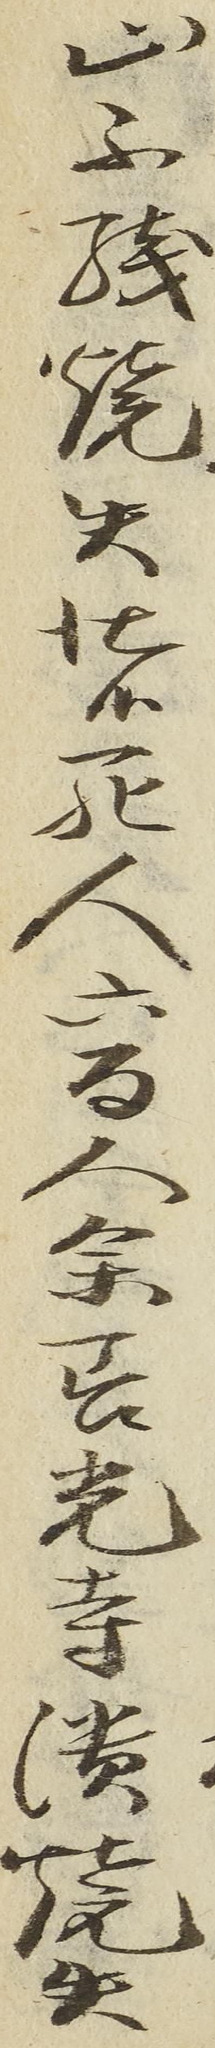山不残焼失仕候死人六百人余善光寺潰焼失

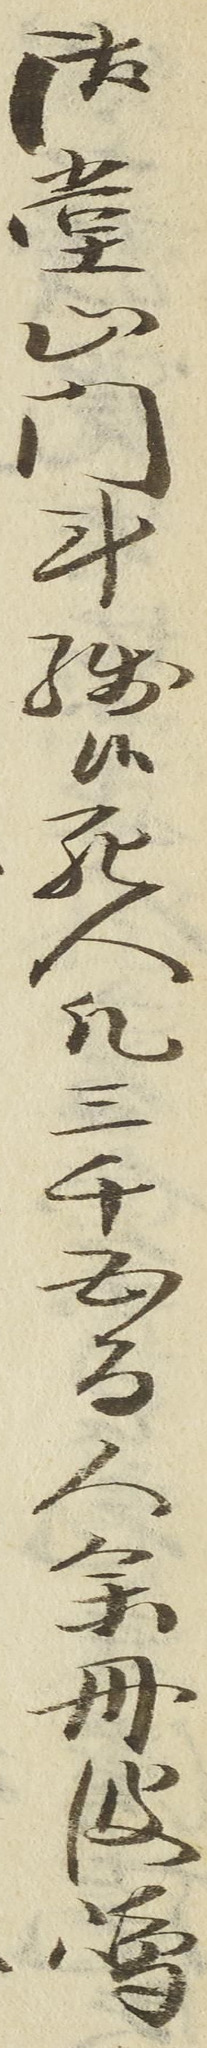御堂山門斗残候死人凡三千五百人余丹波嶋
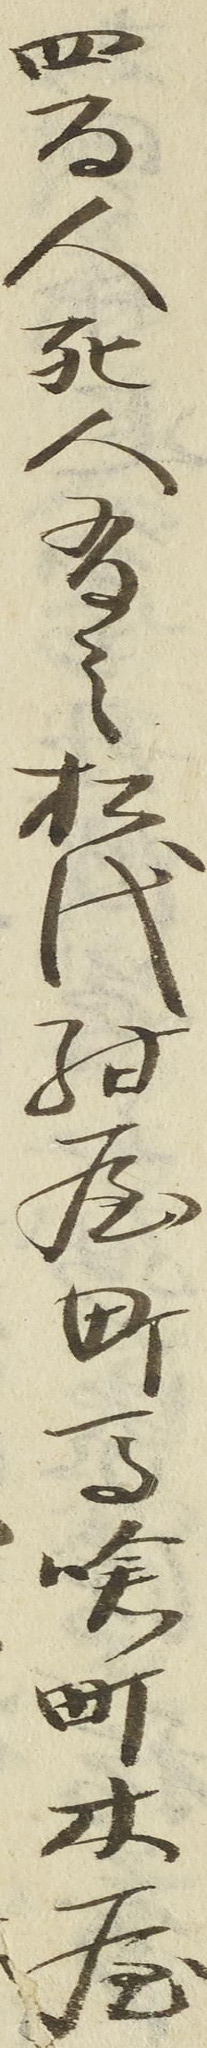四百人死人有之松代紺屋町馬喰町木屋
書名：信濃國大地震記　乾
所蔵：東京大学地震研究所図書室 Earthquake Research Institute Library, The University of Tokyo, JAPAN
